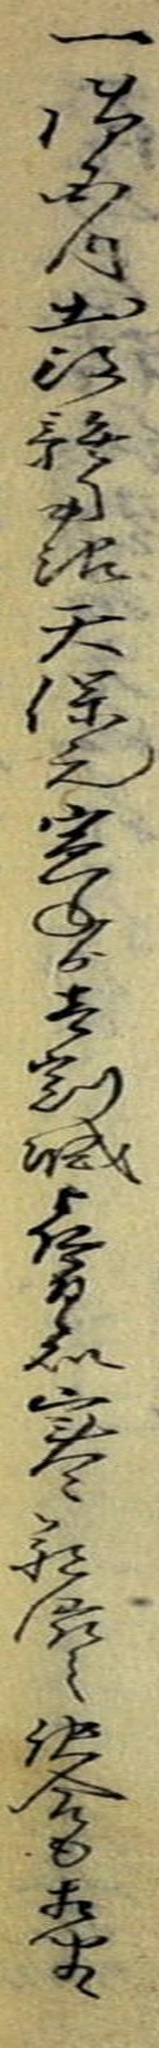一御国内出役雖用銀天保元寅年ゟ壱割減被仰付候処実々難渋之訳合も聞候
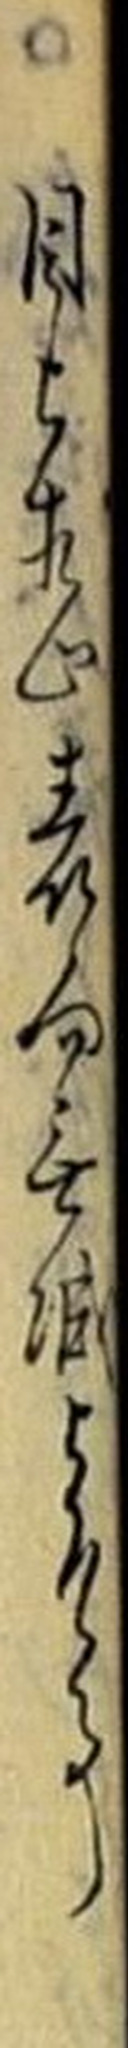目被相止表向無減被下候事
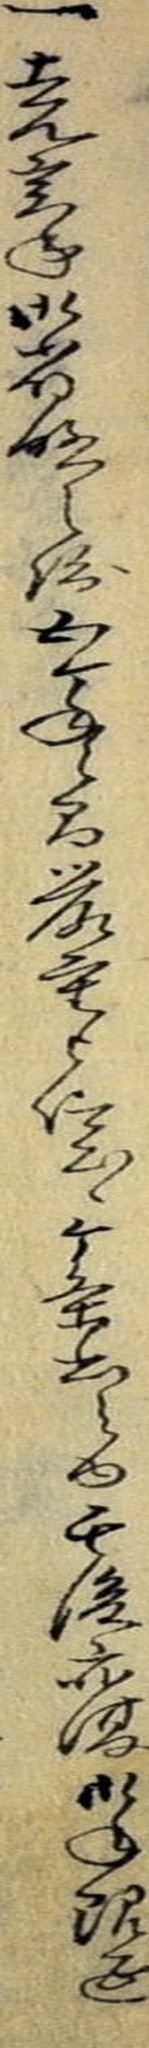一去ル亥年御省略之儀五ヶ年之間厳重被仰出候ヶ条之内其後亦復御年限延
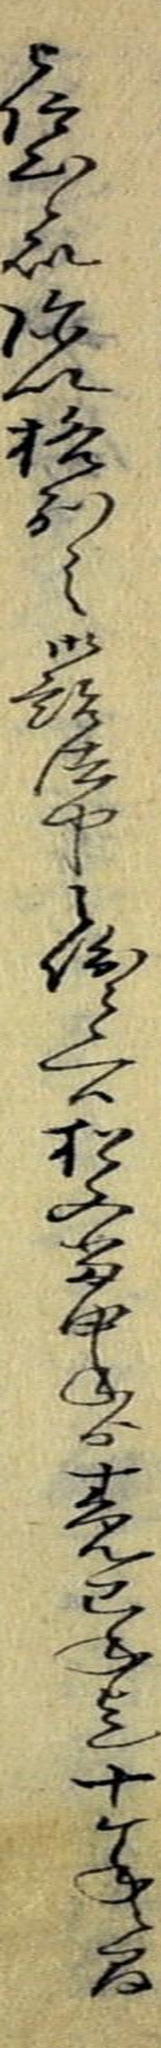被仰出候処弥以格別之御趣法中之儀に候へは猶又当申年ゟ来ル巳年迄十ヶ年之間
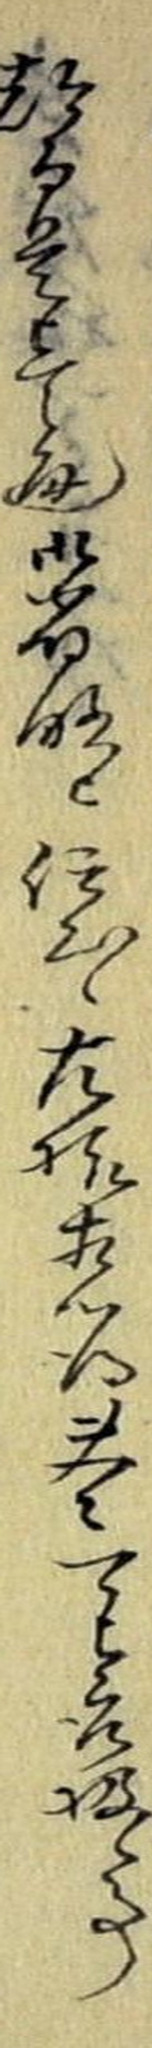都而是迄之通御省略被仰出候左様相心得夫々可被取扱候事
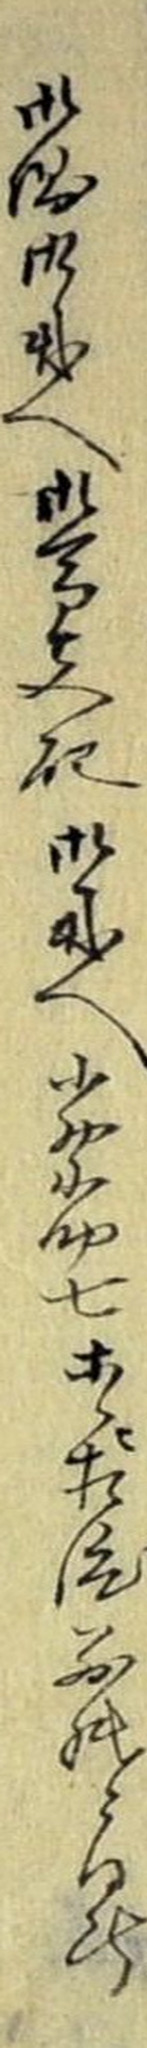御側御用人御馬支配御用人小栗助七等へ被相渡別紙に同断
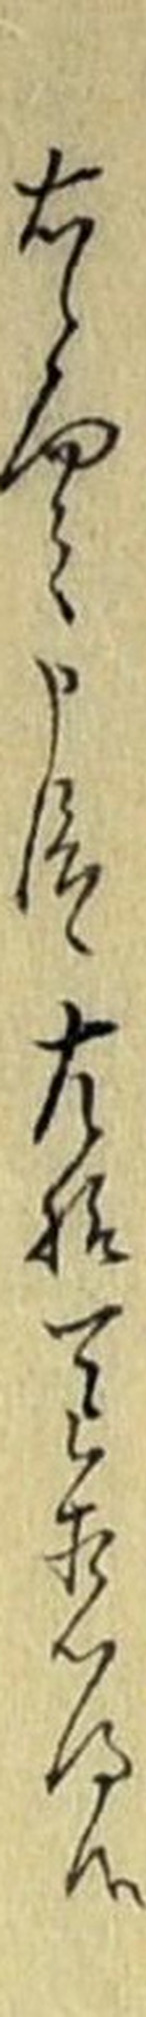右之面々申渡候左様可被相心得候
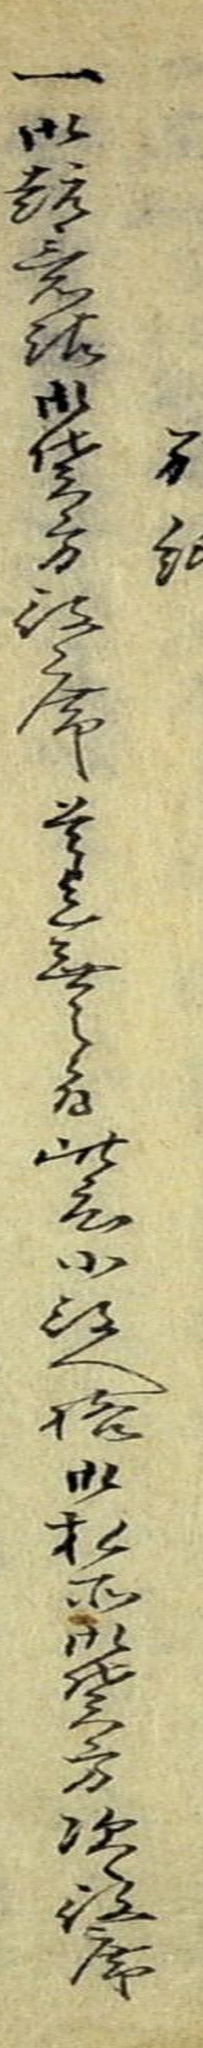一御趣意銀御貸方役席是迄無之此度小役人格御札所御貸方次之役席
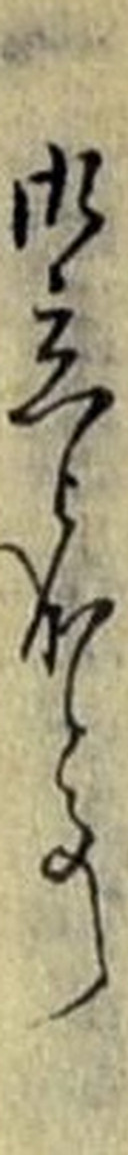御立被成候事
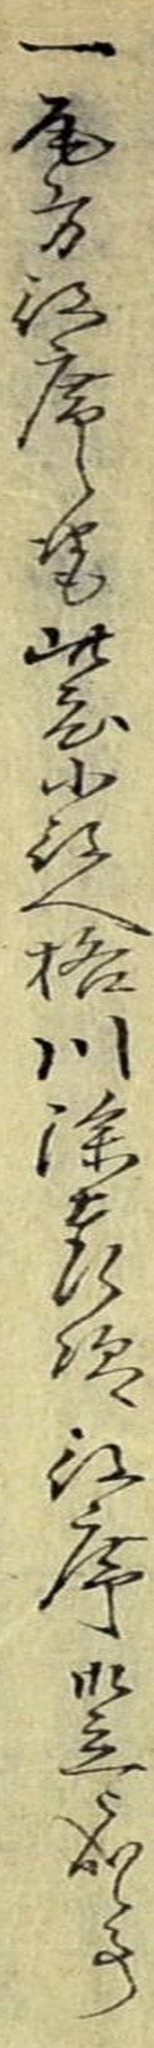一瓦方役席之儀も此度小役人格川除奉行次へ役席御立被成候事
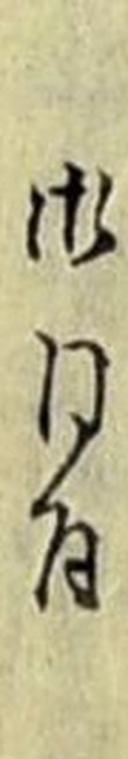御目付
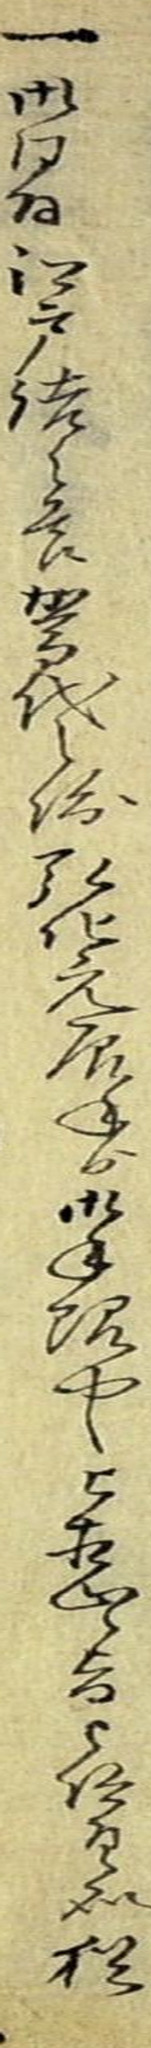一御目付江戸詰之節駕代之儀弘化元辰年ゟ御年限中被相止候旨被仰付候処猶
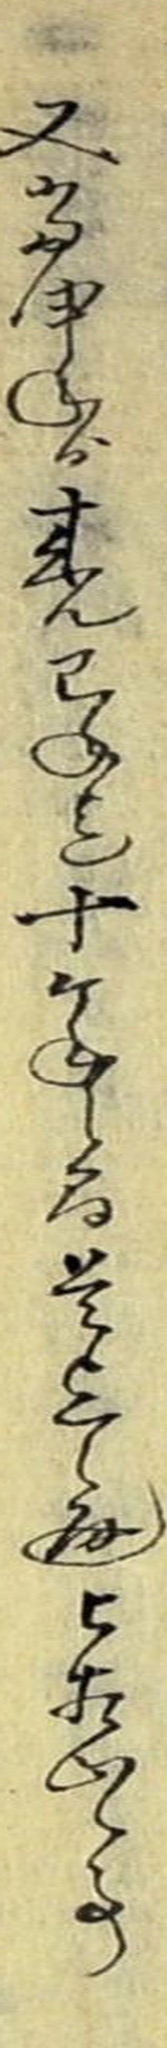又当申年ゟ来ル巳年迄十ヶ年之間是迄之通被相止候事
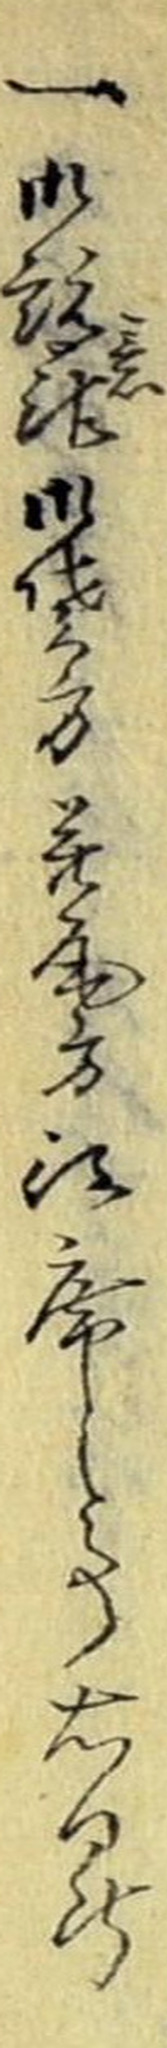一御趣意銀御貸方井瓦方役席之事右同断

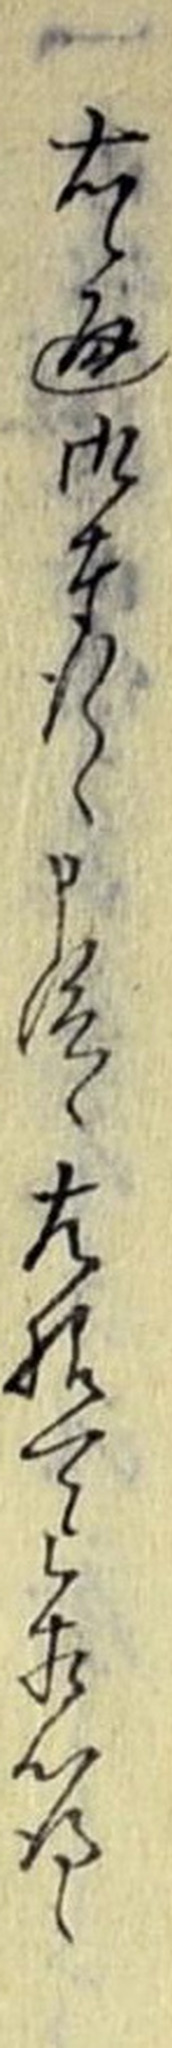右之通御奉行へ申渡候左様可被相心得候
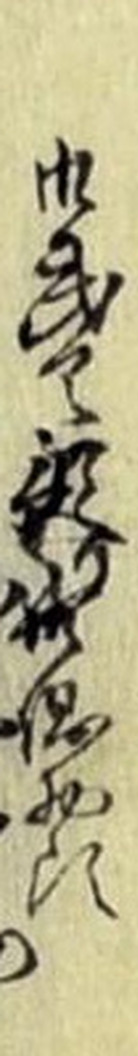御武具預り御側物頭
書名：命令之部 六
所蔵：福井県文書館 Fukui Prefectural Archives
